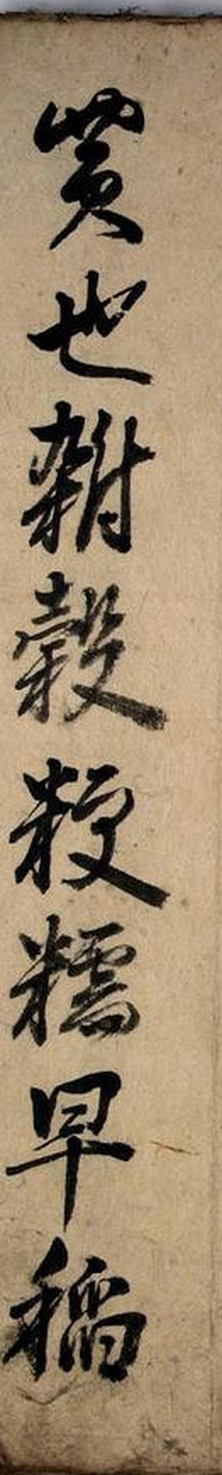買也雑穀粳糯早稲

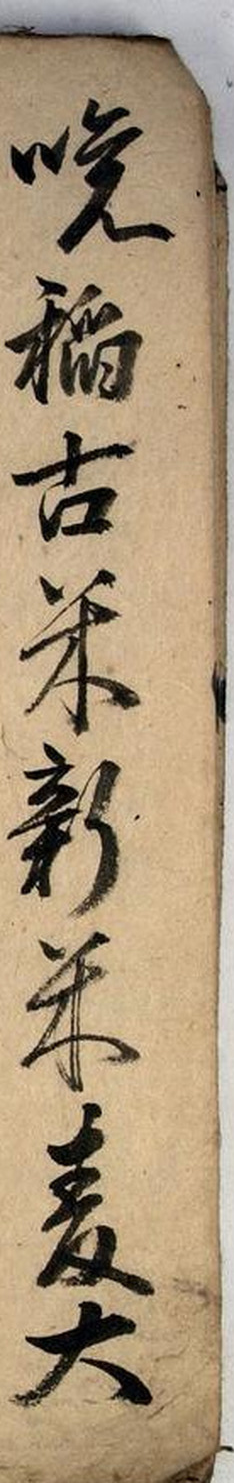晩稲古米新米麦大
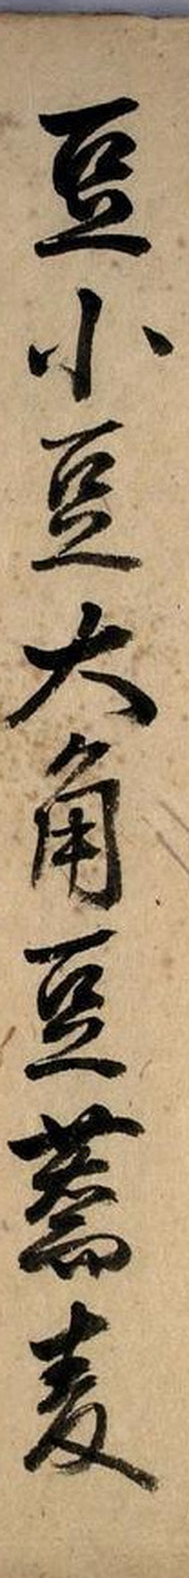豆小豆大角豆蕎麦
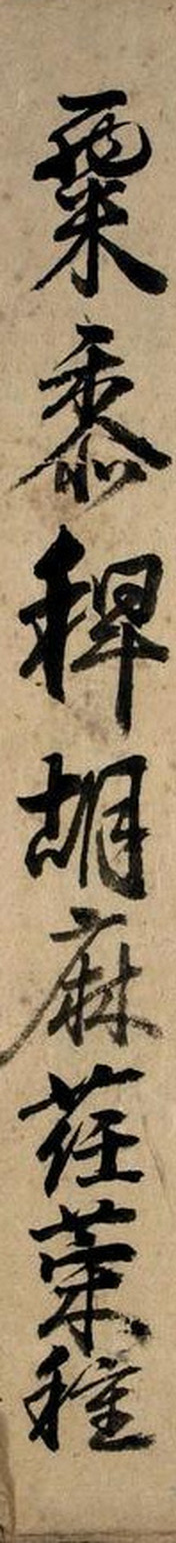粟黍稗胡麻荏胡麻
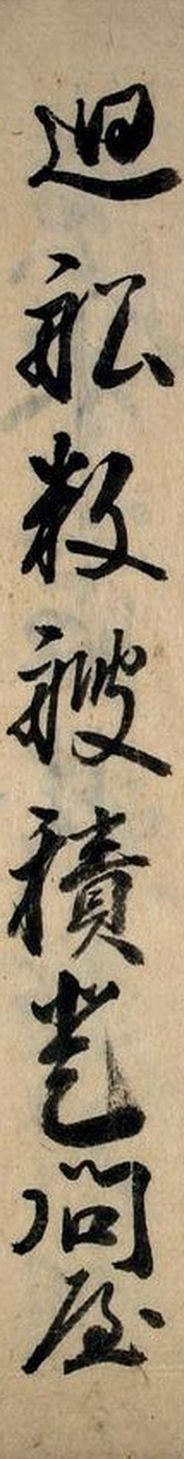廻船数艘積登問屋

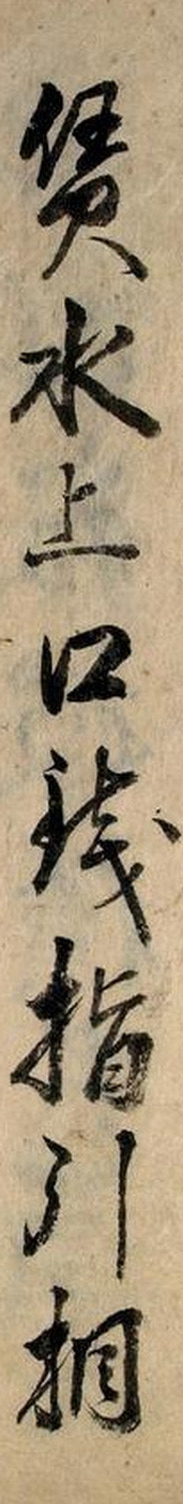賃水上口銭差引相
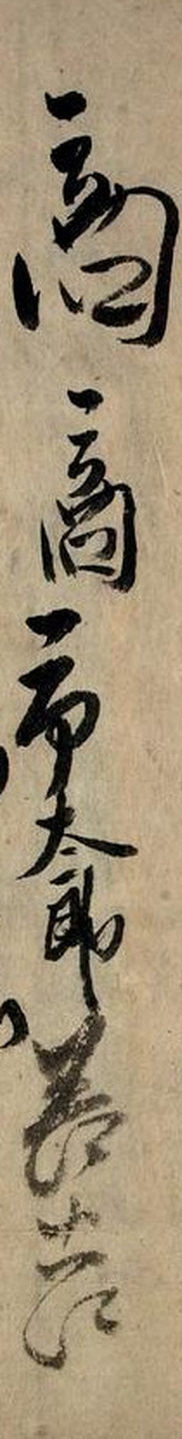商商市太郎善吉
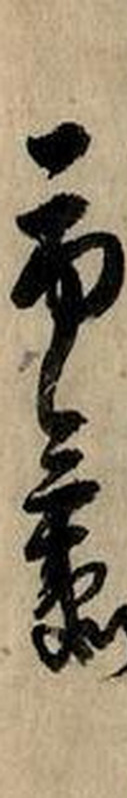市兵衛
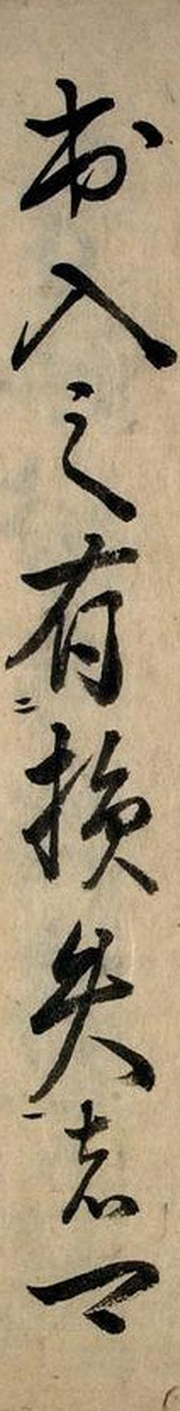出入之有損失者令
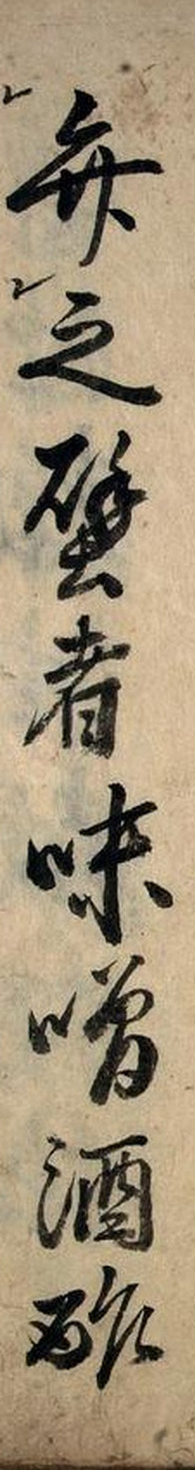弁之壁者味噌酒酢

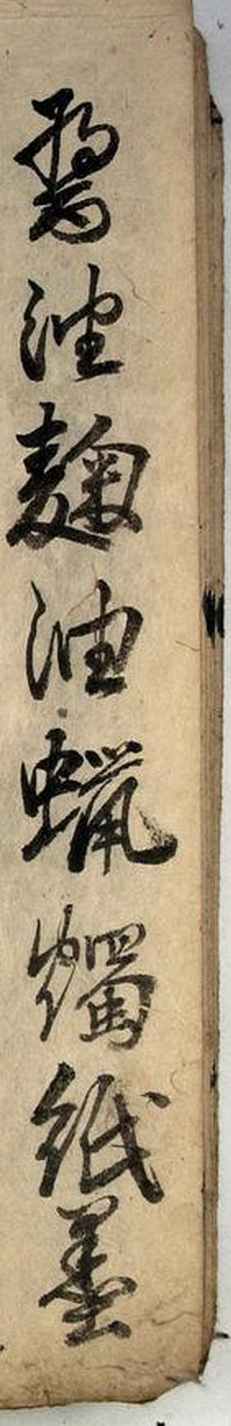醤油麹油蝋燭紙墨
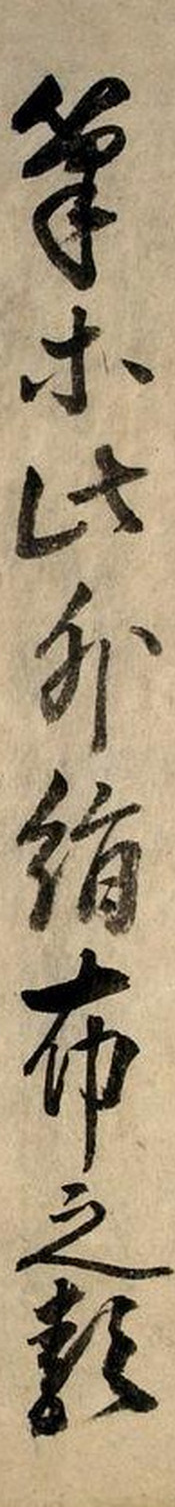筆等此外絹布之類
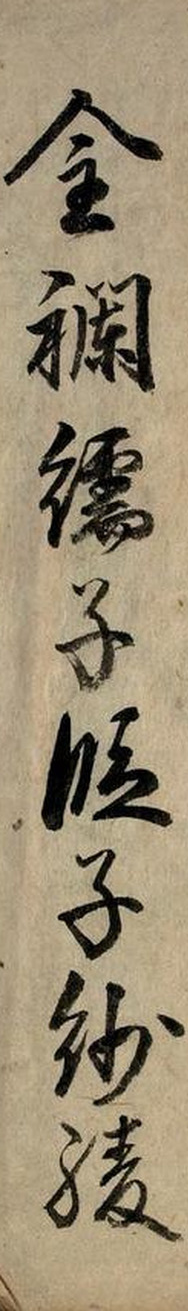金襴襦子段子沙綾
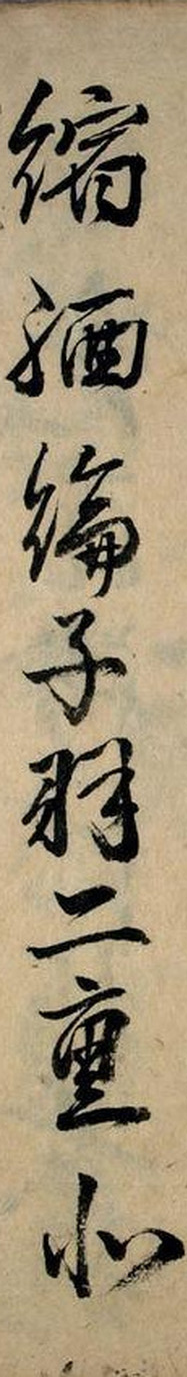縮緬綸子羽二重北
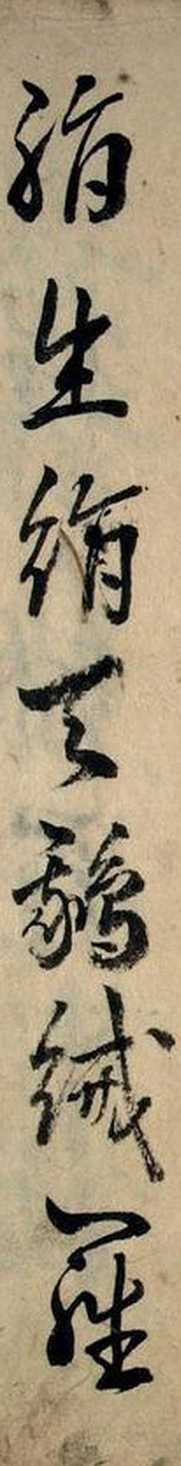絹生絹天鵝織羅

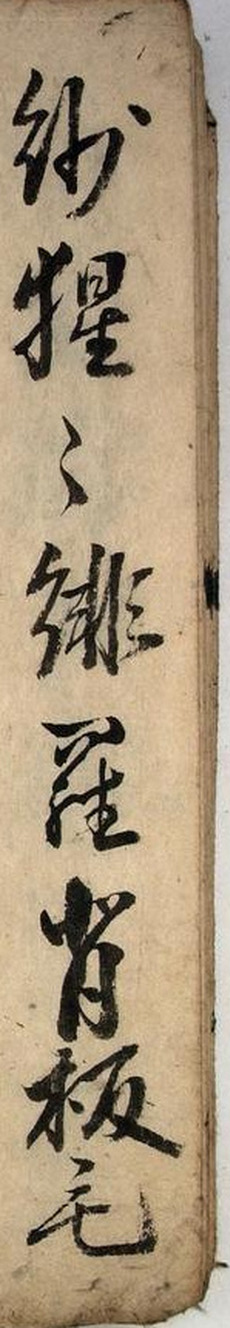沙猩〃緋羅背板毛
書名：商売往来（往来物、手習）
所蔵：福井県文書館 Fukui Prefectural Archives
